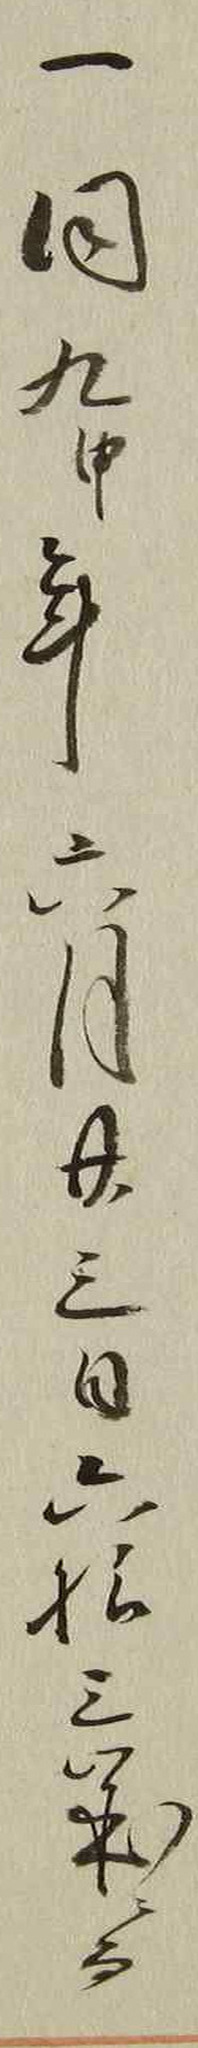一同九申年六月廿三日六拾三歳ニ而
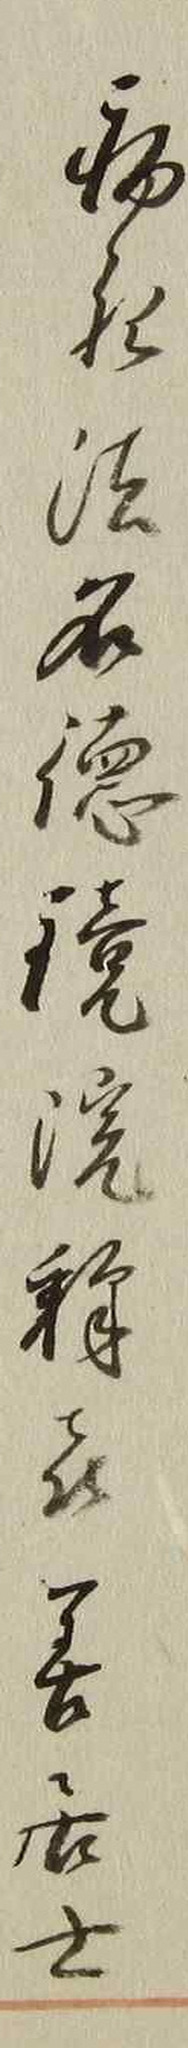病死法名徳鏡院釈喜善居士
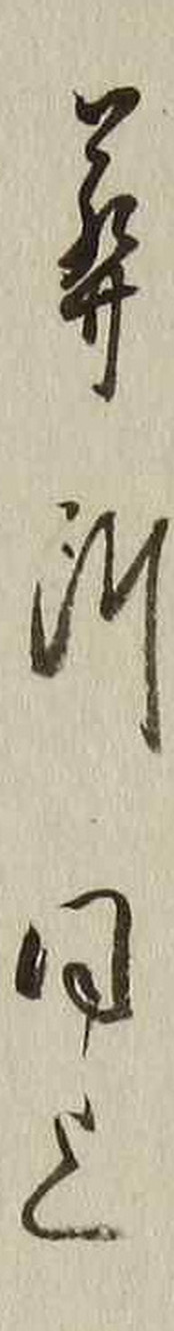葬所同上
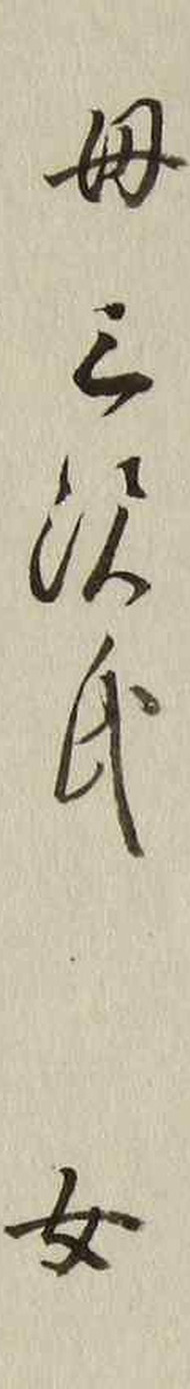母三沢氏女
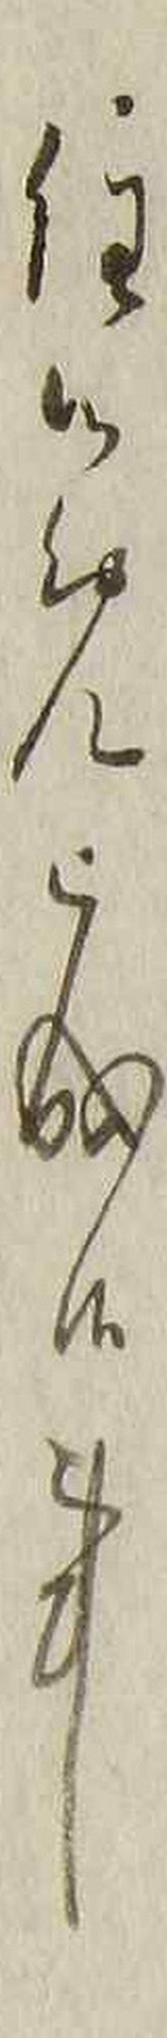住御免被成候事

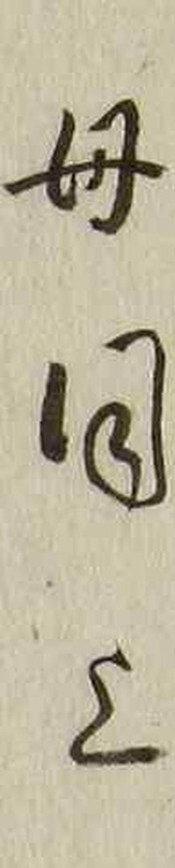母同上
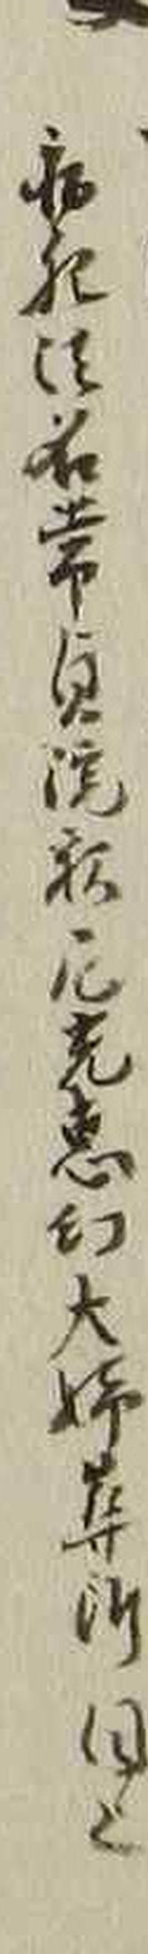病死法名常貞院釈尼光恵幻大姉葬所同上
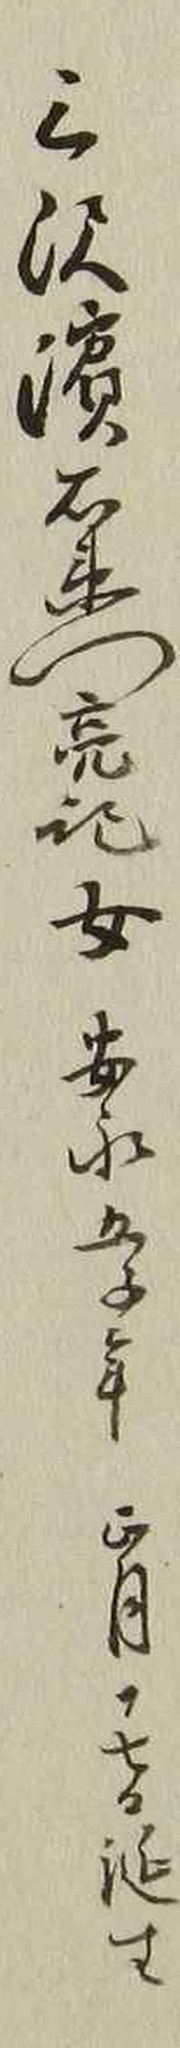三沢浜右衛門亮記女安永五子年正月十七日誕生
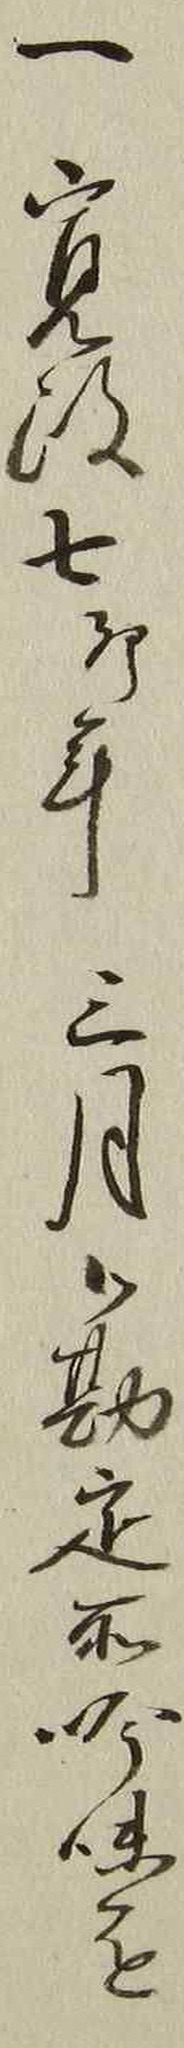一寛政七卯年三月御勘定所吟味懸
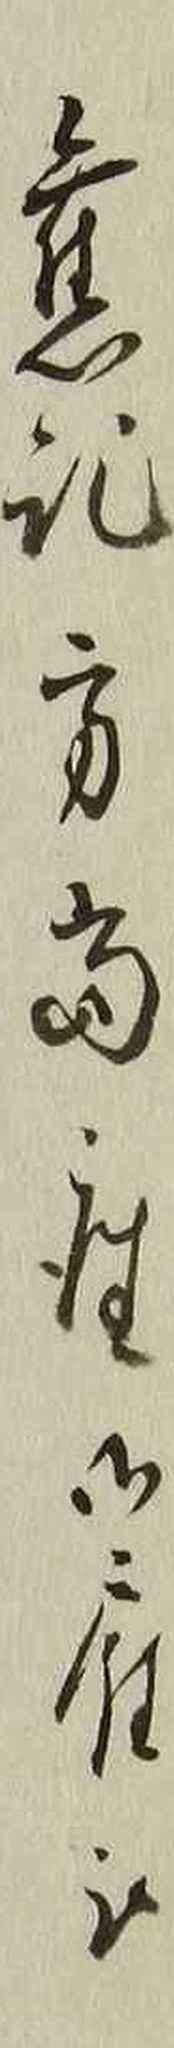旧記方当座御雇被
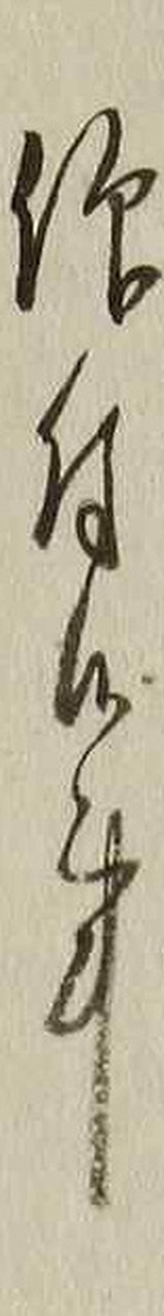仰付候事
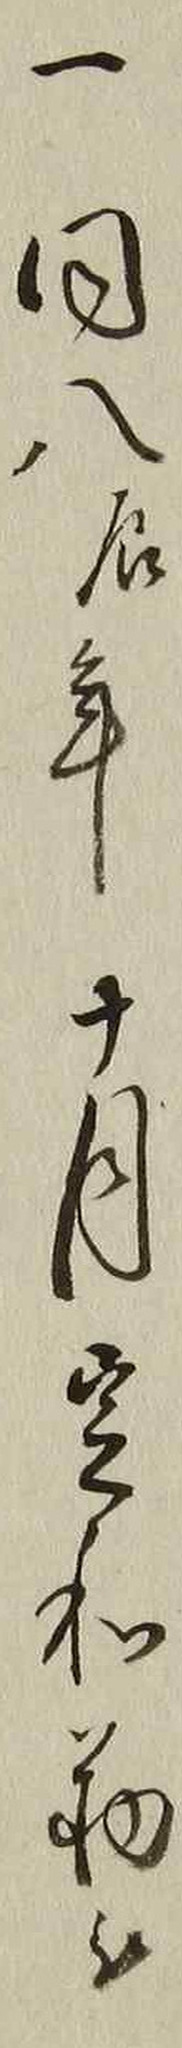一同八辰年十月定和勤被
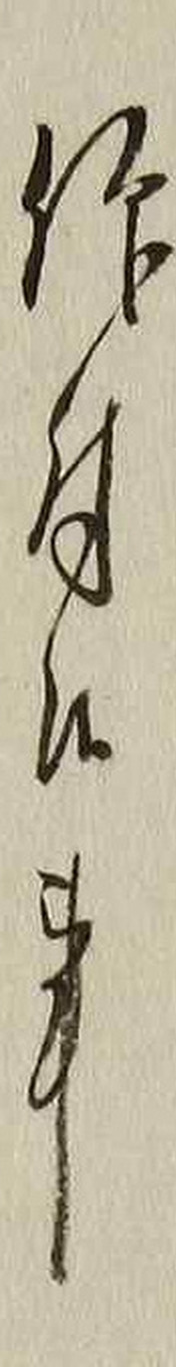仰付候事
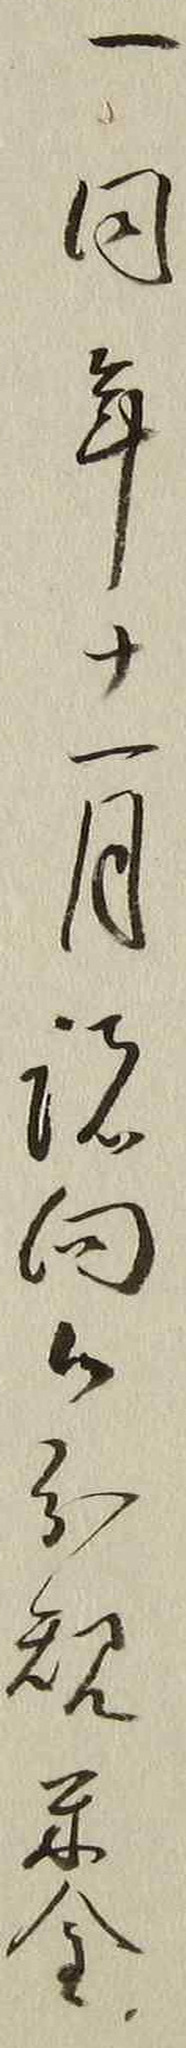一同年十一月諸向御分規米金
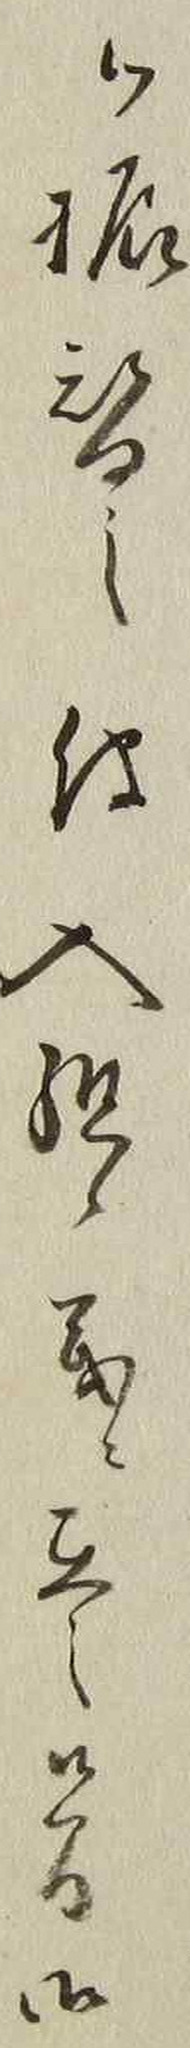御振替之儀入組候義ニ在之候間御
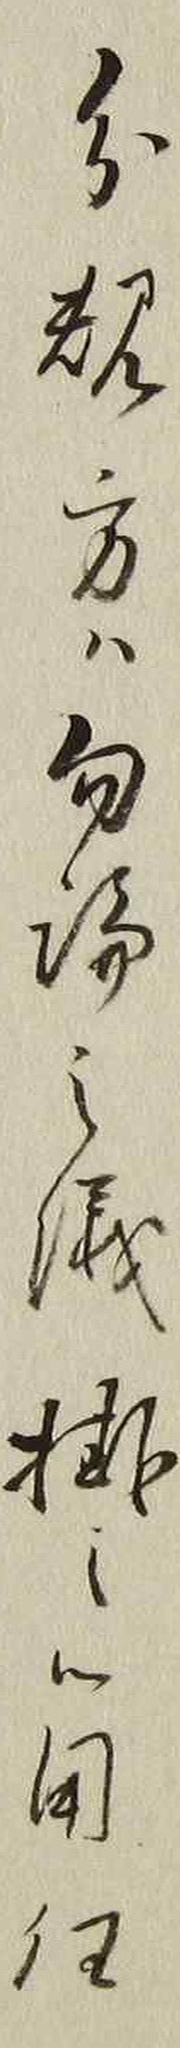分規方ハ勿論之儀掛之御用任
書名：諸士系譜　巻之132　た之部8
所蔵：会津若松市立会津図書館
